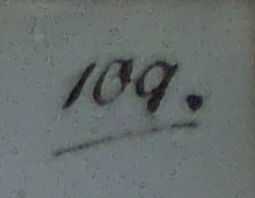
109.
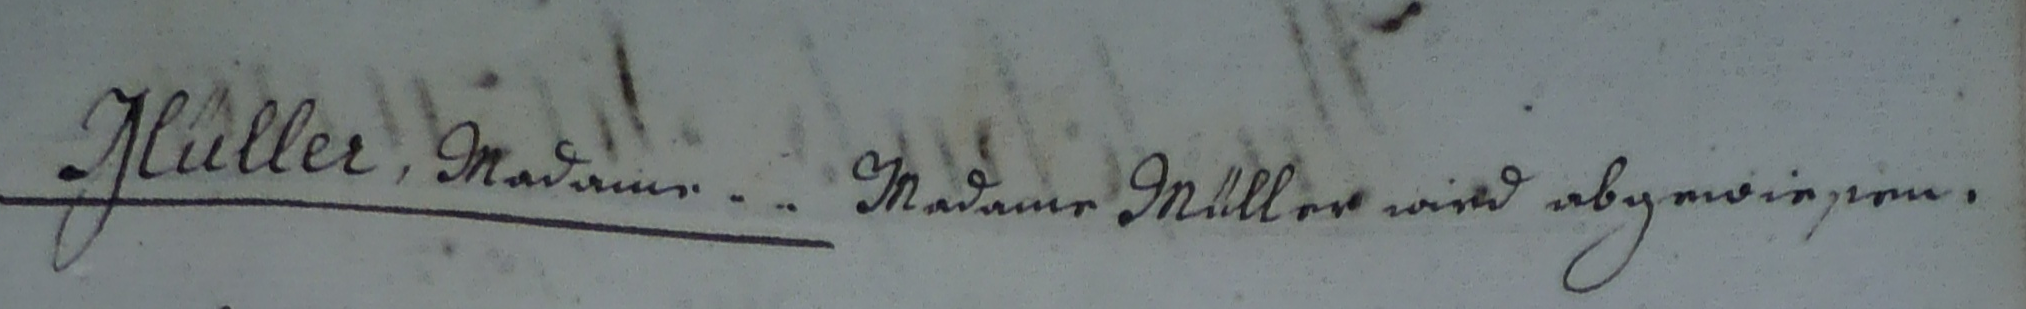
Müller, Madame .. .. Madame Müller wird abgewiesen.
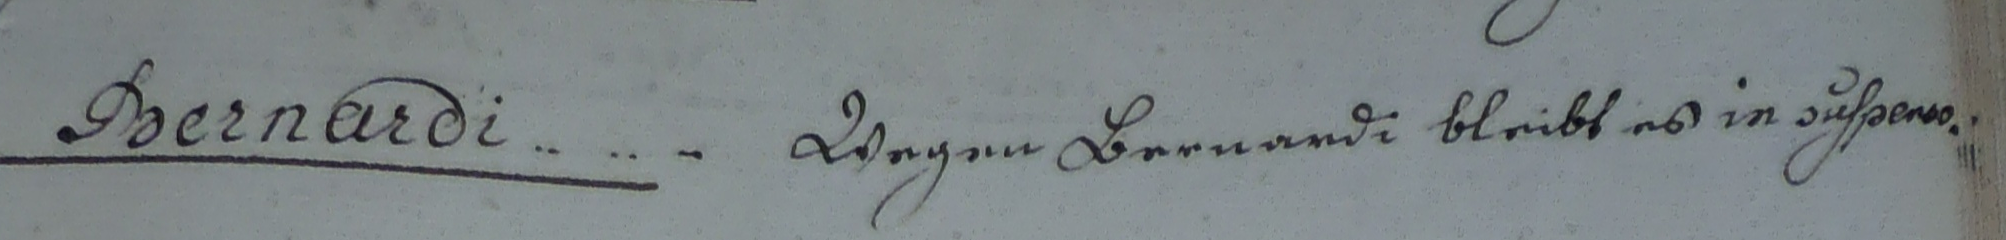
Bernardi .. .. .. Wegen Bernardi bleibt es in suspenso.
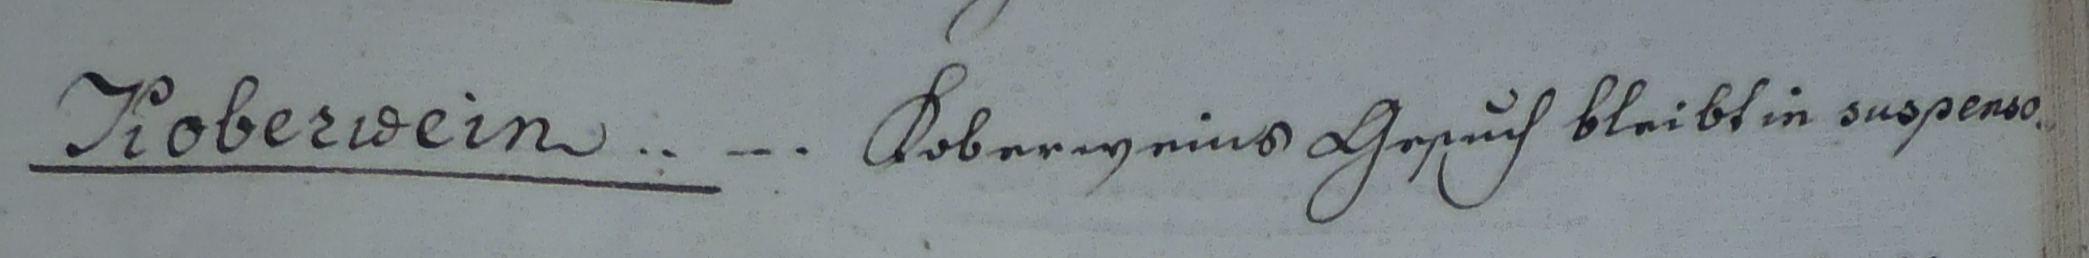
Koberwein .. .. . Koberweins Gesuch bleibt in suspenso.
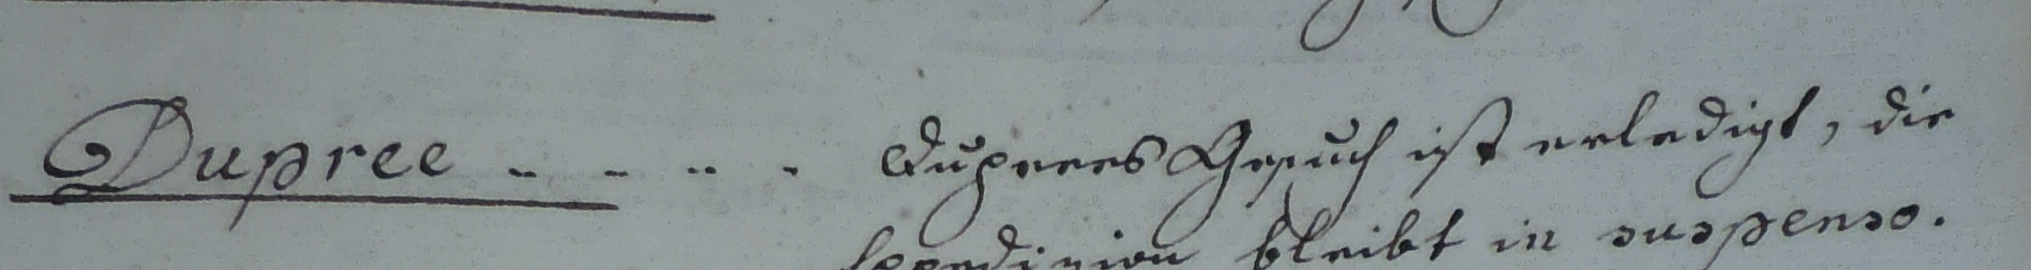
Dupree .. .. .. .. Duprees Gesuch ist erledigt, die
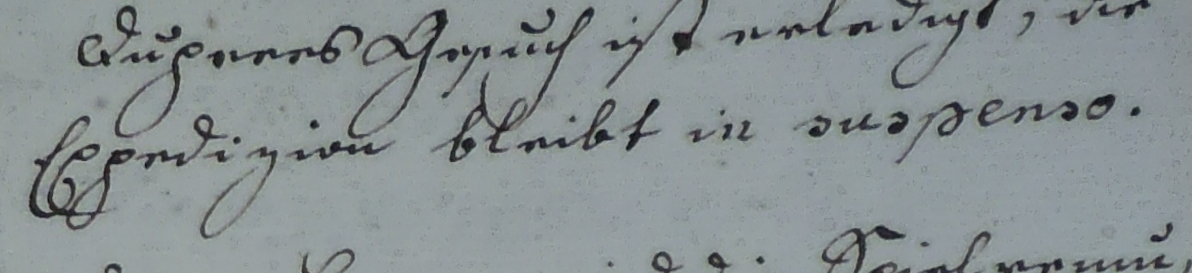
Expedizion bleibt in suspenso.
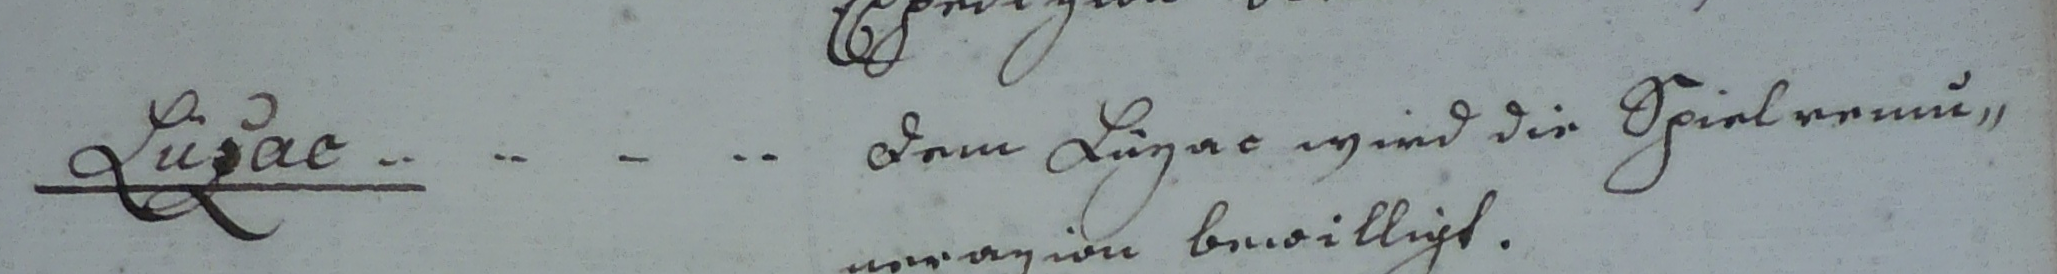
Luzac .. .. .. .. Dem Luzac wird die Spielremu¬
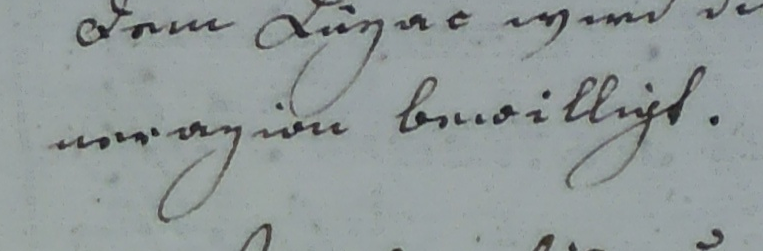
nerazion bewilligt.
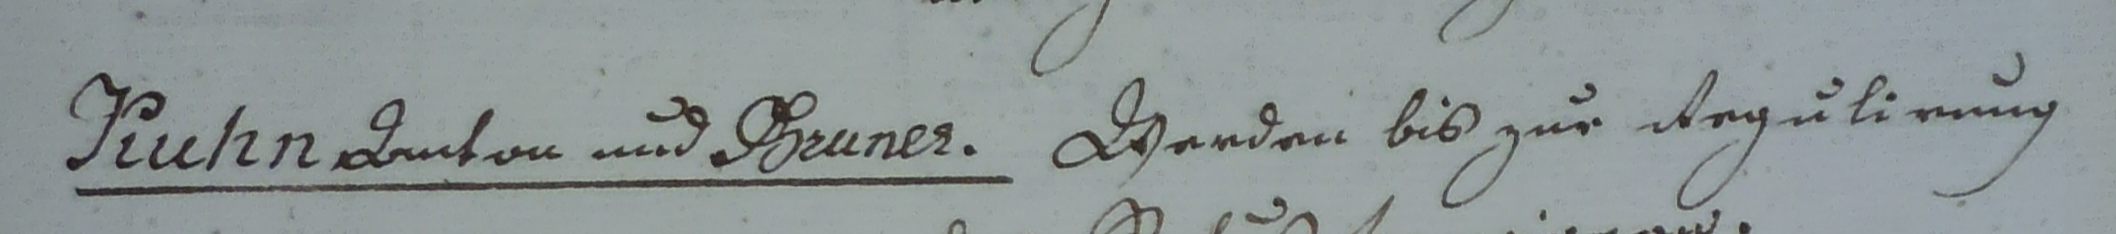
Kuhn, Anton und Bruner. Werden bis zur Regulirung
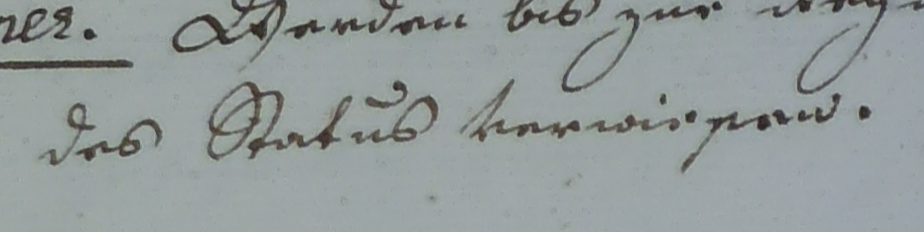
des Status verwiesen.
